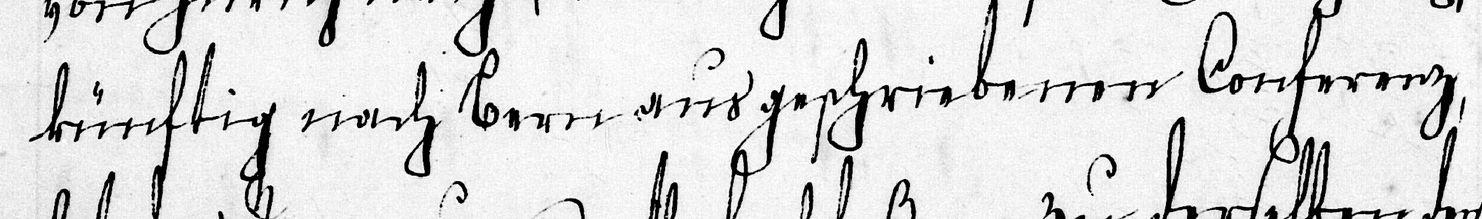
tkünftig nach Bern ausgeschriebenen Conferenz,
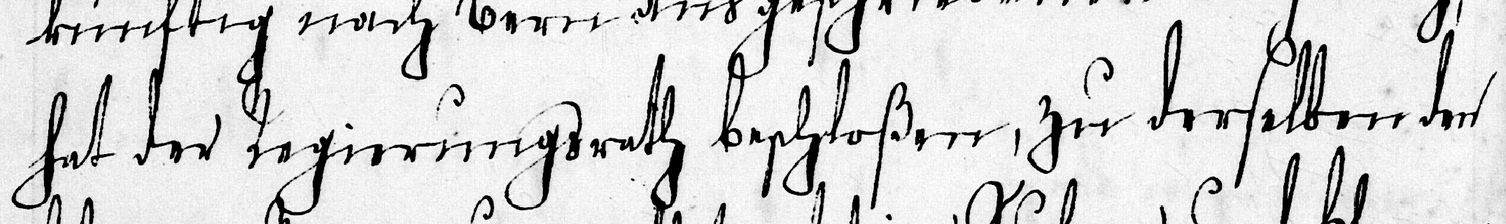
hat der Regierungsrath beschloßen, zu derselben den
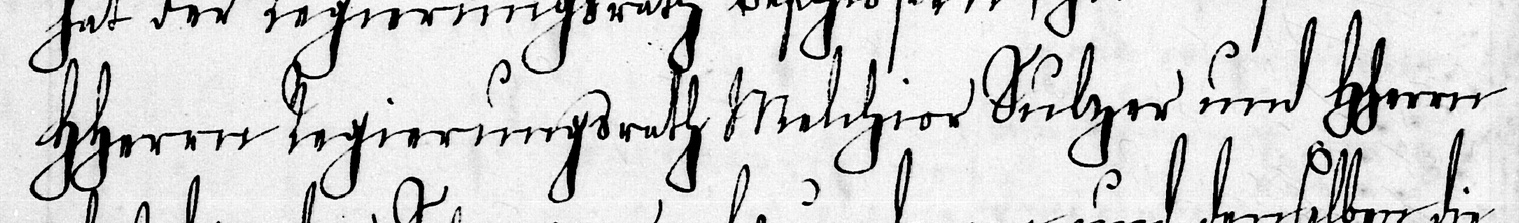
HHerrn Regierungsrath Melchior Sulzer und HHerrn
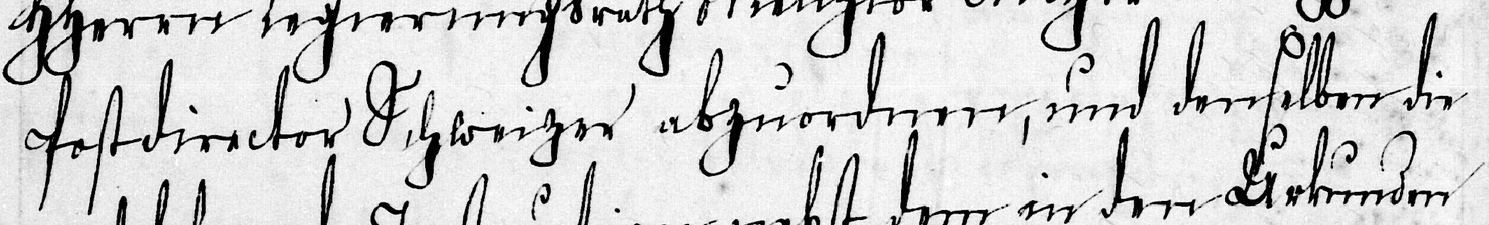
Postdirector Schweizer abzuordnen, und denselben die
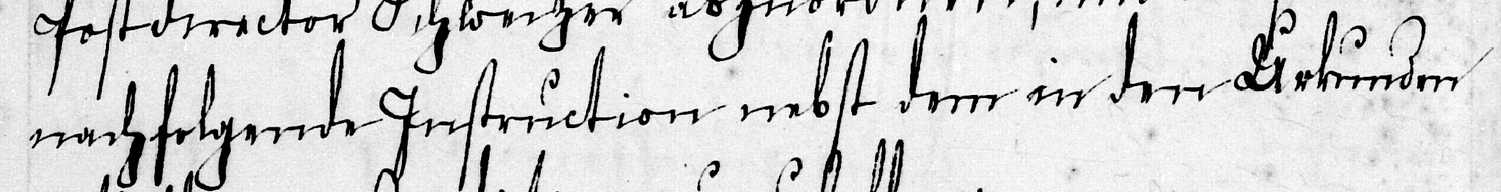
nachfolgende Instruction nebst dem in den Urkunden
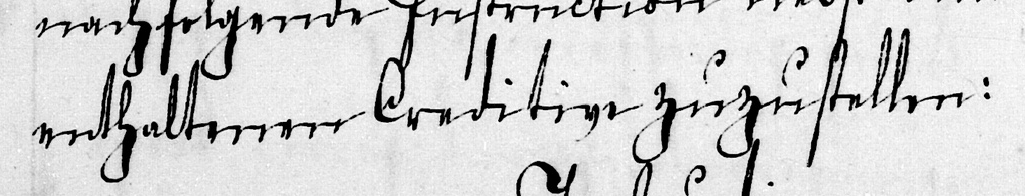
enthaltenen Creditive zuzustellen:
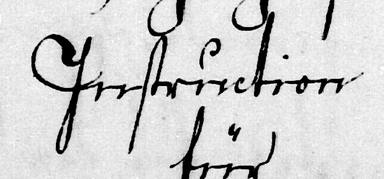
Instruction
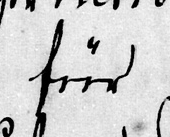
für
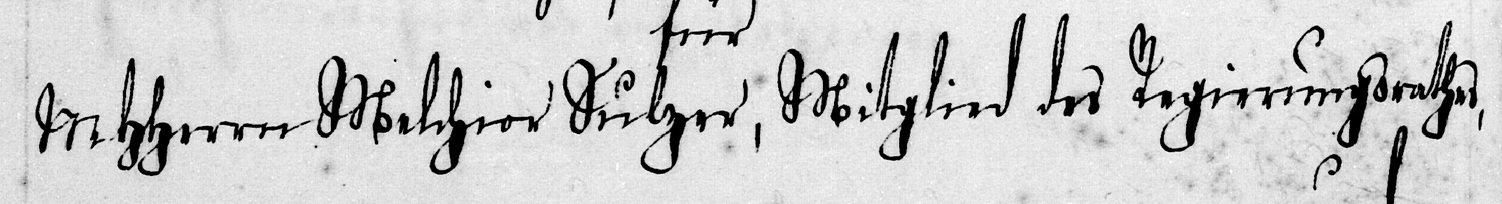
MHHerrn Melchior Sulzer, Mitglied des Regierungsrath¬
